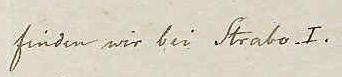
finden wir bei Strabo I.
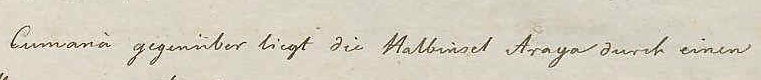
Cumanà gegenüber liegt die Halbinsel Araya durch einen
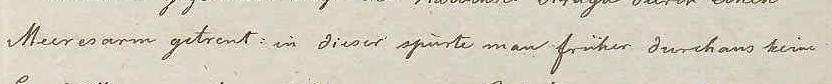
Meeresarm getrent: in dieser spürte man früher durchaus keine
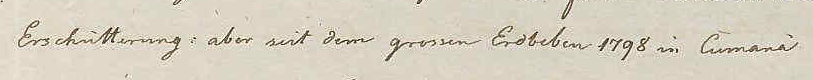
Erschütterung: aber seit dem grossen Erdbeben 1798 in Cumanà
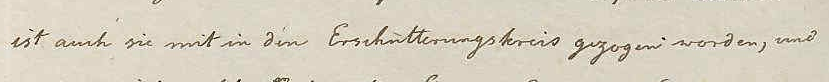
ist auch sie mit in den Erschütterungskreis gezogen worden, und
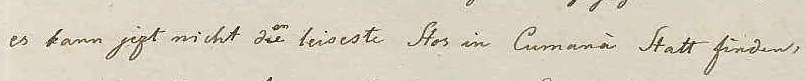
es kann jezt nicht dieer leiseste Stos in Cumanà Statt finden,
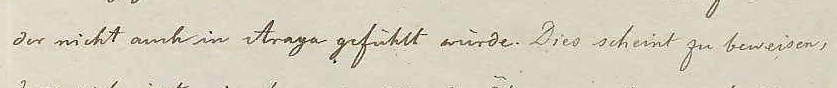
der nicht auch in Araya gefühlt würde. Dies scheint zu beweisen,
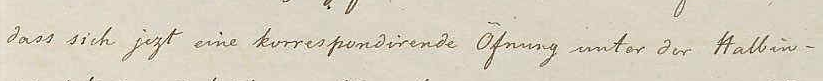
dass sich jezt eine korrespondirende Öfnung unter der Halbin-
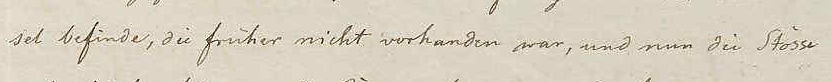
sel befinde, die früher nicht vorhanden war, und nun die Stösse
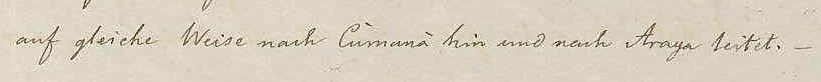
auf gleiche Weise nach Cumanà hin und nach Araya leitet. –
